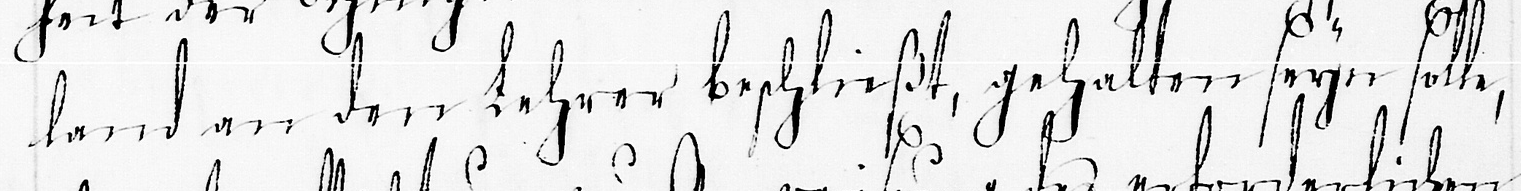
land an den Lehrer beschließt, gehalten seyn soll¬
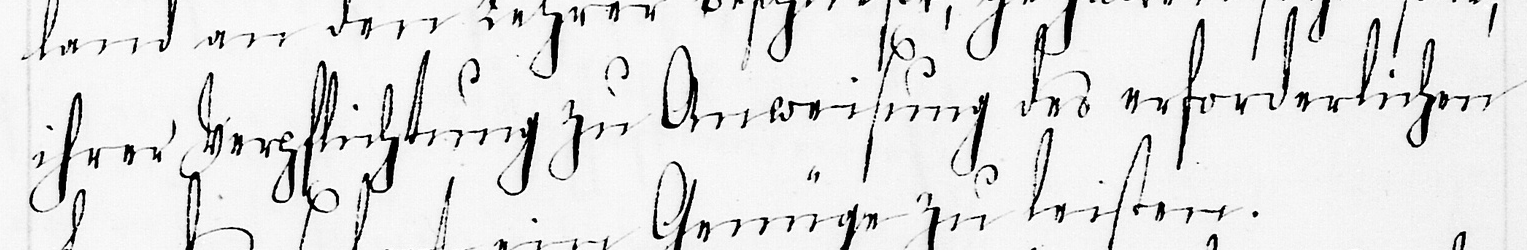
ihrer Verpflichtung zu Anweisung des erforderlichen
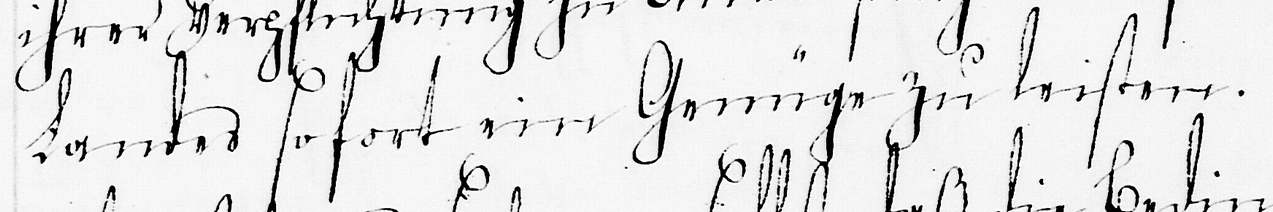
Landes sofort ein Genüge zu leisten.
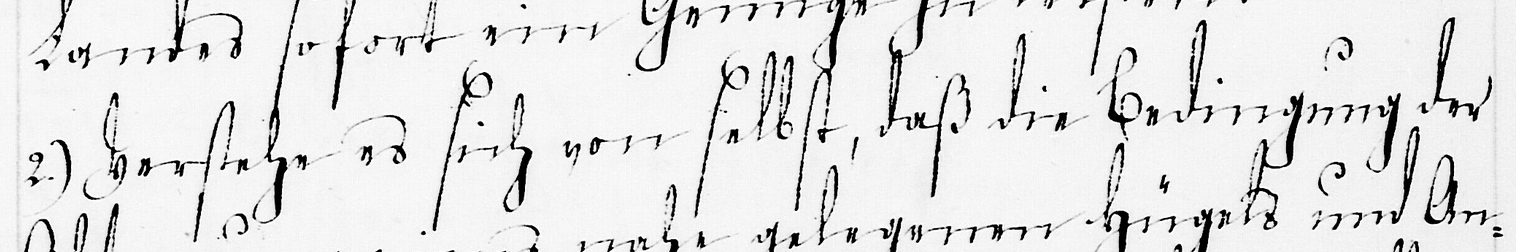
2.) Verstehe es sich von selbst, daß die Bedingung der
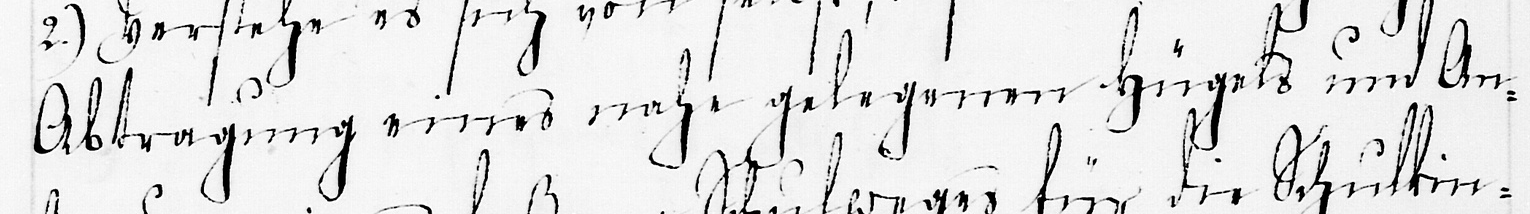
Abtragung eines nahe gelegenen Hügels und An¬
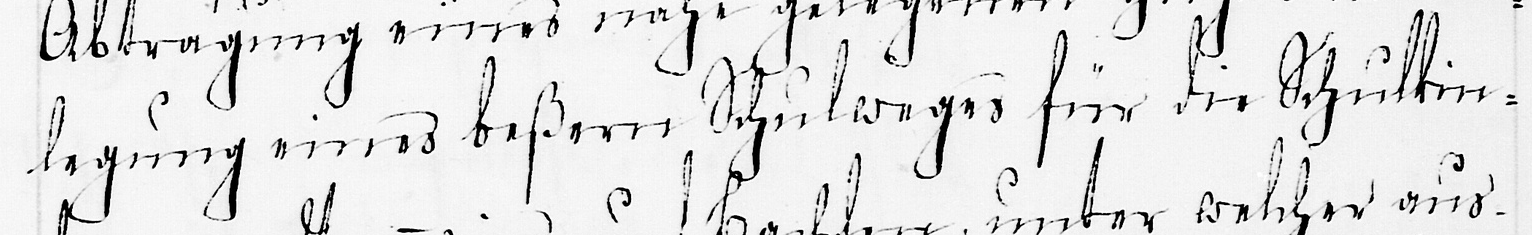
legung eines beßern Schulweges für die Schulkin¬
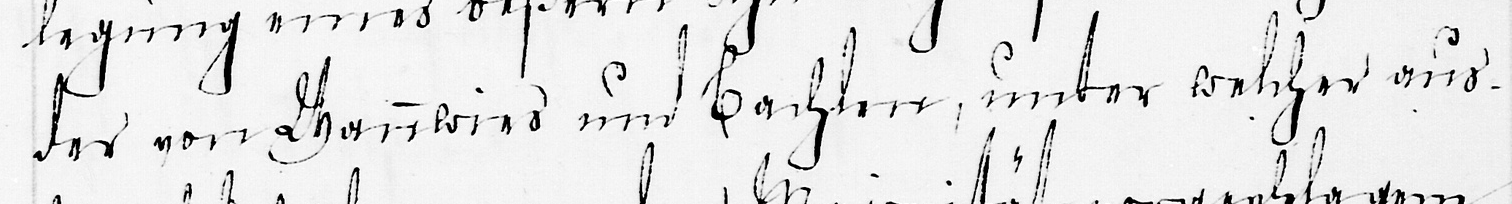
der von Wannwies und Bachlen, unter welcher aus¬
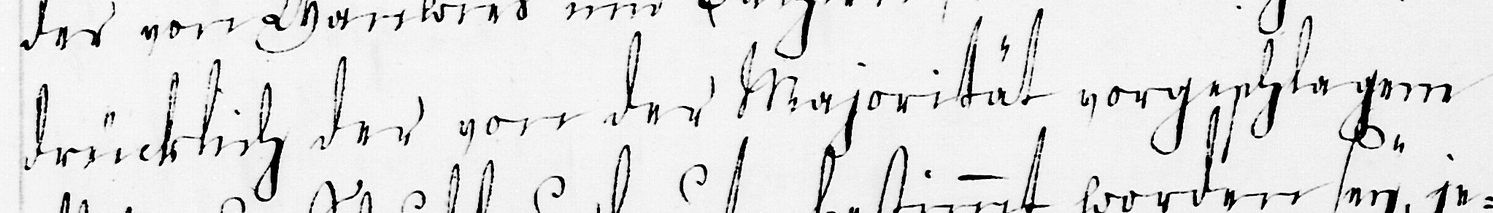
drücklich der von der Majorität vorgeschlagene
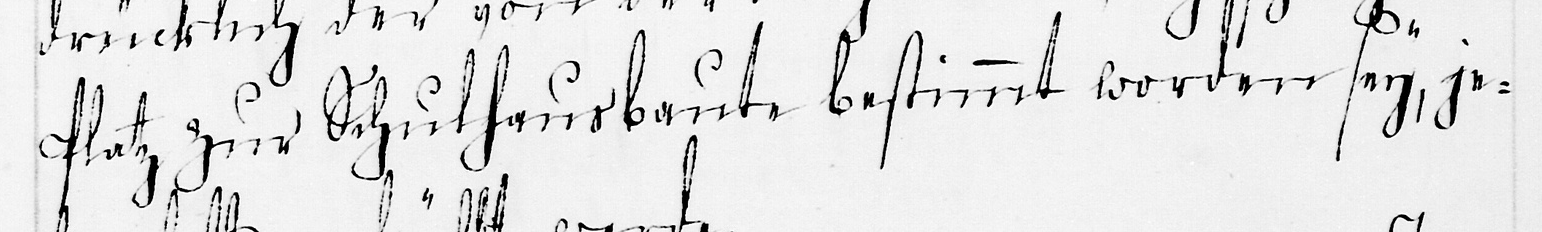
Platz zur Schulhausbaute bestimmt worden sey, je¬
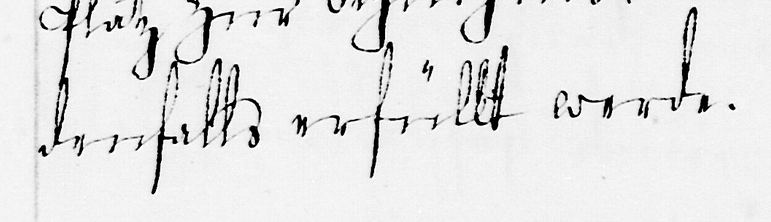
denfalls erfüllt werde.
